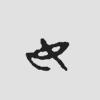女
